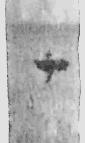十
